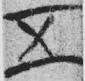五
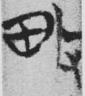畋（田）
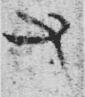又（有）
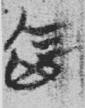○（禽）
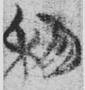利
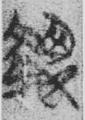執（執）
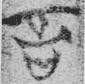言
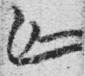亡（无）
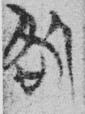咎
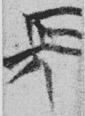長
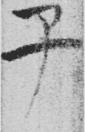子
